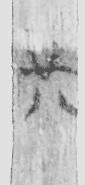{廿八}
